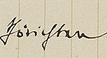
thörichter
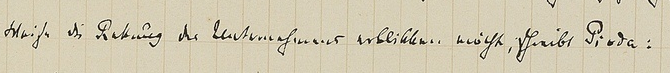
Weise die Rettung des Unternehmens erblikken möcht, schreibt Pioda:
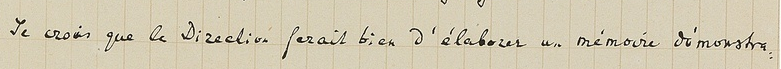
«Je crois que la Direction ferait bien d'élaborer un mémoire démonstra-
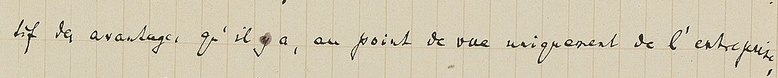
tif des avantages qu'il y a, au point de vue uniquement de l'entreprise,
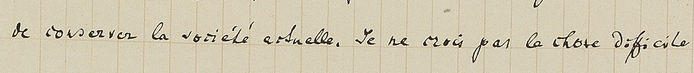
de conserver la société actuelle. Je ne crois pas la chose difficile
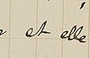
et elle
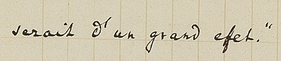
serait d'un grand effet.»
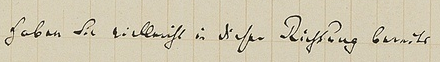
Haben Sie vielleicht in dieser Richtung bereits
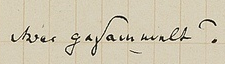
etwas gesammelt?
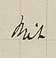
Mit
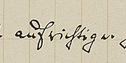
aufrichtiger
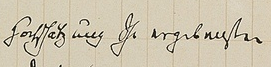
Hochschätzung Ihr ergebenster
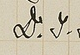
Dr J.
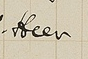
Bern,
